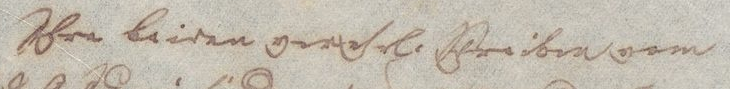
Ihre beiden verehrl. Schreiben vom
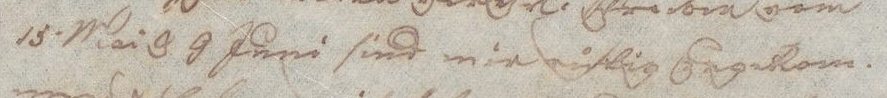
15 Mai & 9 Juni sind mir richtig zugekom-
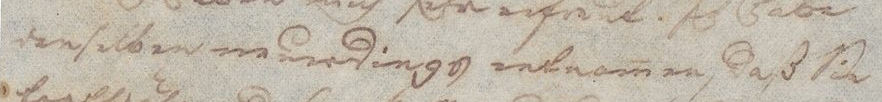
denselben neuerdings entnommen, daß Sie
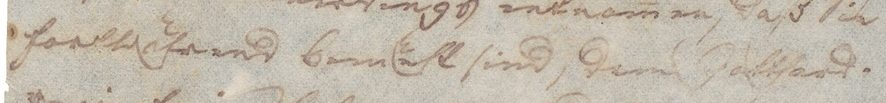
fortwährend bemüht sind, dem Gotthard -
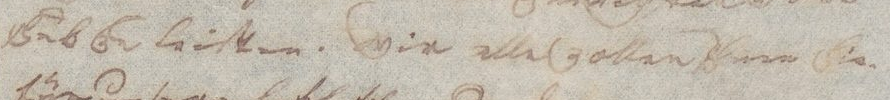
schub zu leisten. Wir alle zollen Ihnen hie-
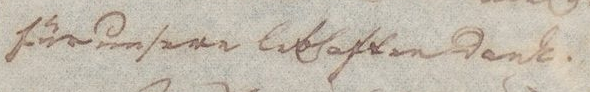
für unsern lebhaften Dank.
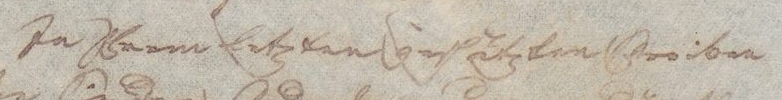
In Ihrem letzten geschätzten Schreiben
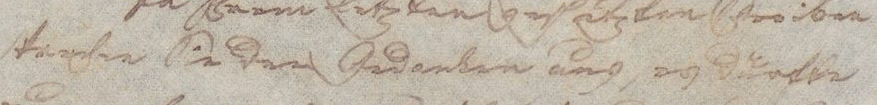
sprechen Sie den Gedanken aus, es dürfte
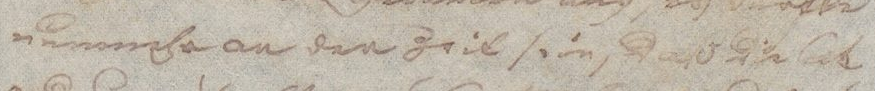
nunmehr an der Zeit sein, daß die Ab-
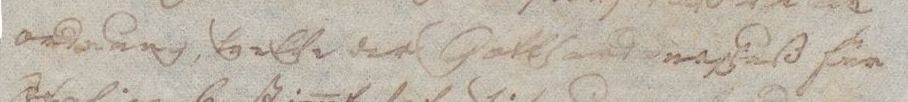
ordnung, welche der Gotthardausschuß für
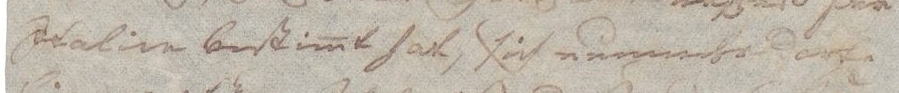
Italien bestimmt hat, sich nunmehr dort-
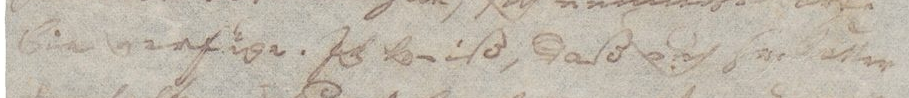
hin verfüge. Ich weiß, daß auch Hr. Koller
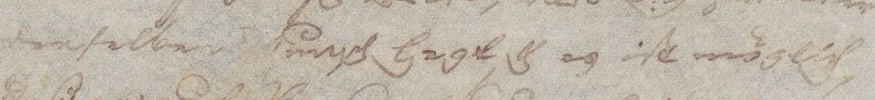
denselben Wunsch hegt, & es ist möglich,
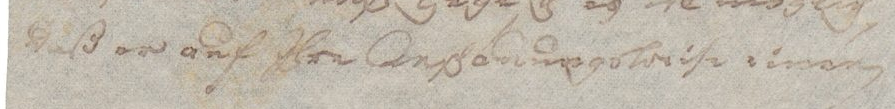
daß er auf Ihre Anschauungsweise einen
